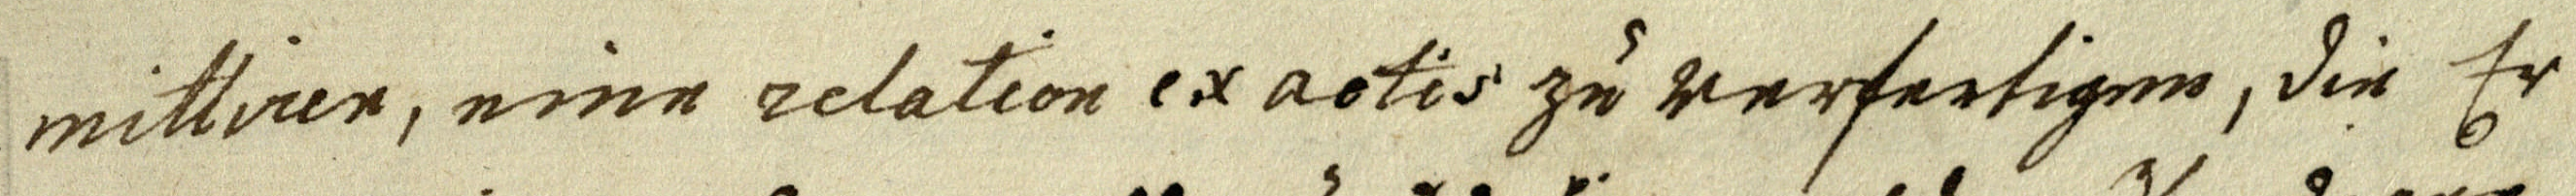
mittiren, eine relation ex actis zu verfertigen, die Er
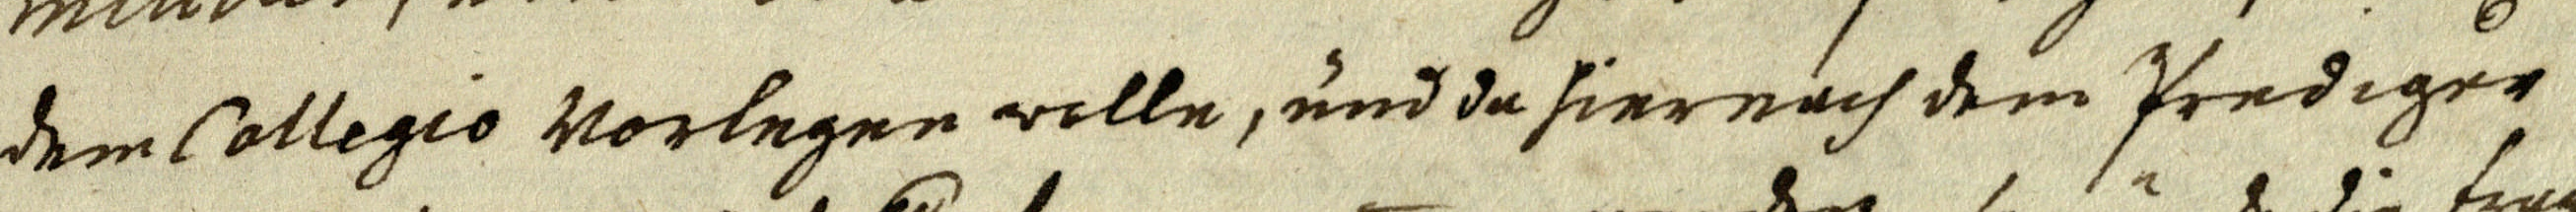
dem Collegio vorlegen wolle, und da hiernach dem Prediger
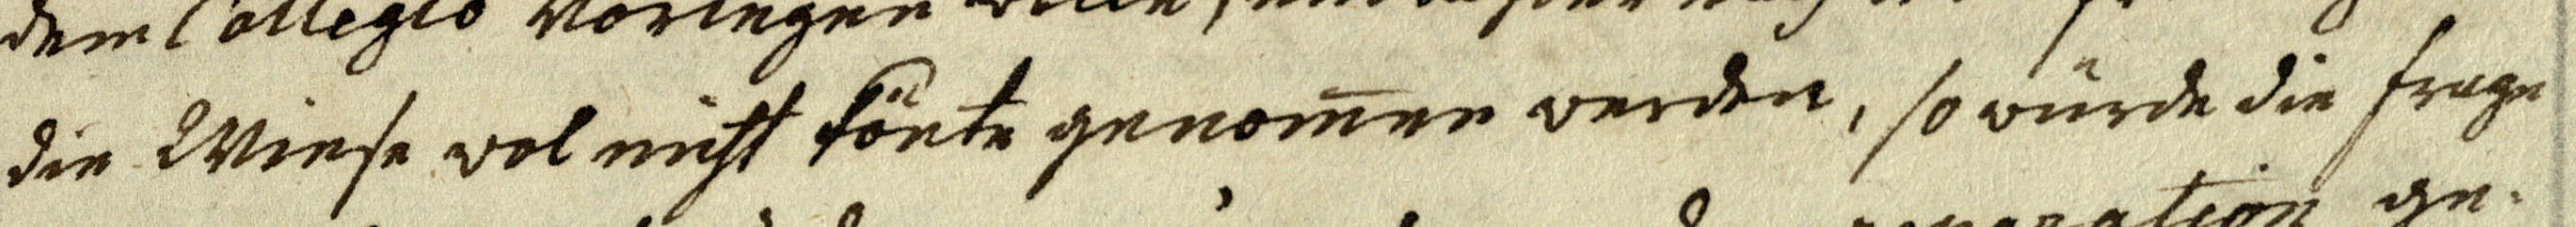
die Wiese wol nicht könte genomen werden, so würde die Frage
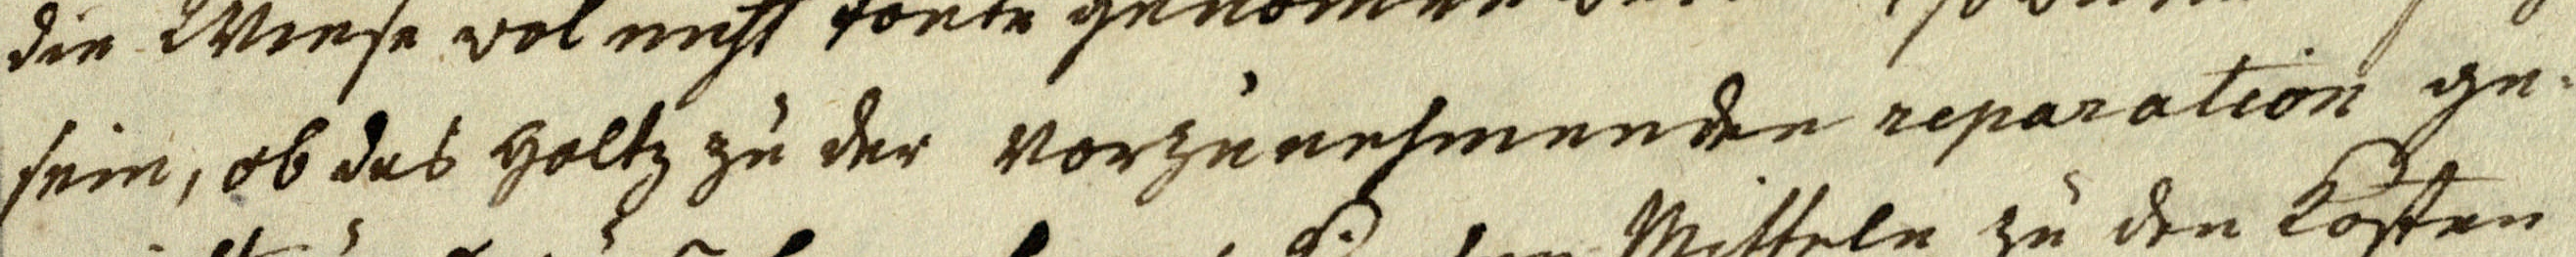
sein, ob das Holtz zu der vorzunehmenden reparation ge¬
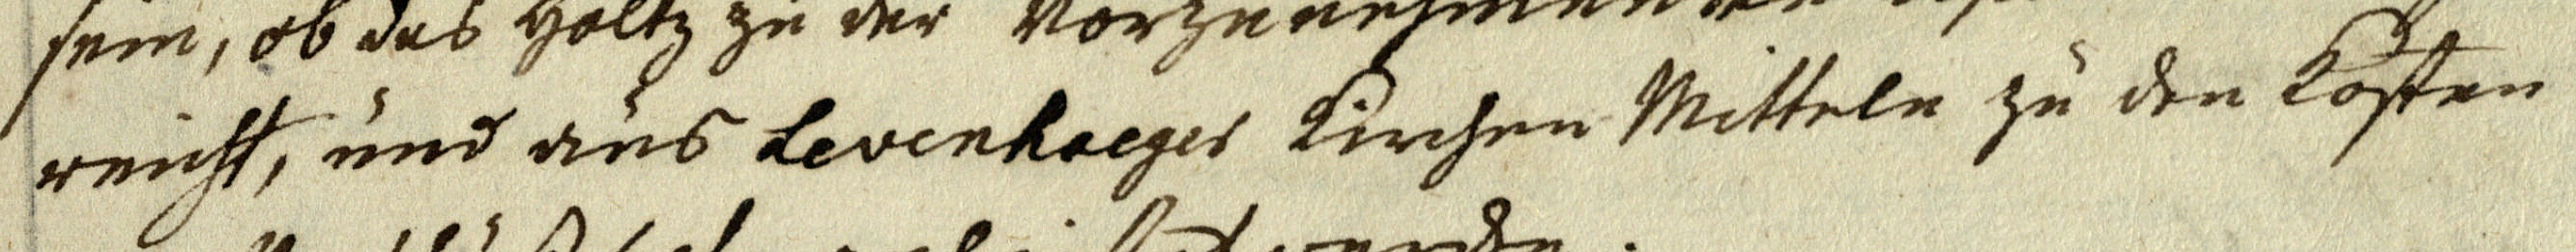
reicht, und aus Levenhaeger Kirchen Mitteln zu den Kosten
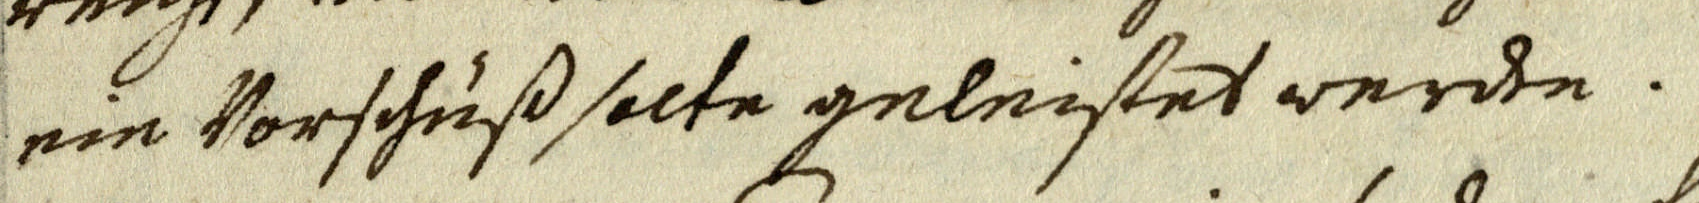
ein Vorschuß solte geleistet werden.
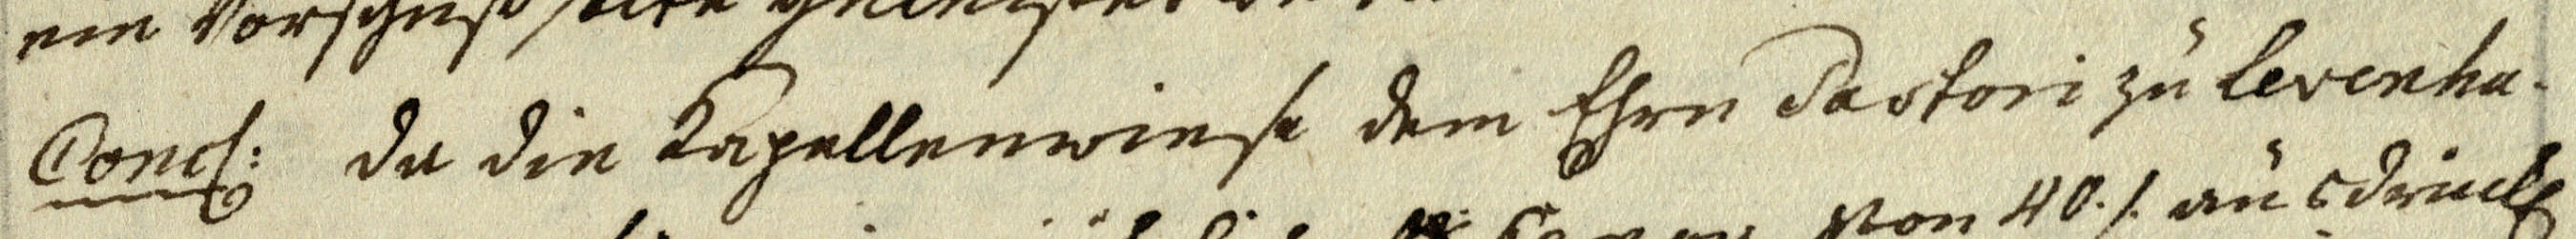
Concl. Da die Kapellenwiese dem Ehrn Pastori zu Levenha¬
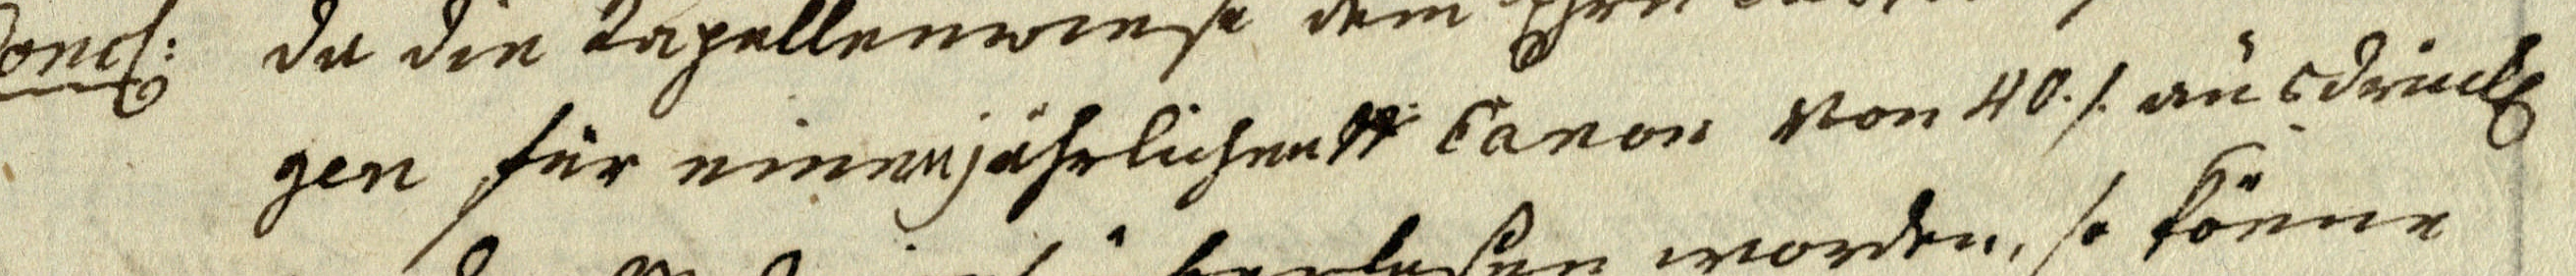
gen für einen jährlichen Canon von 40. s. ausdrückl.
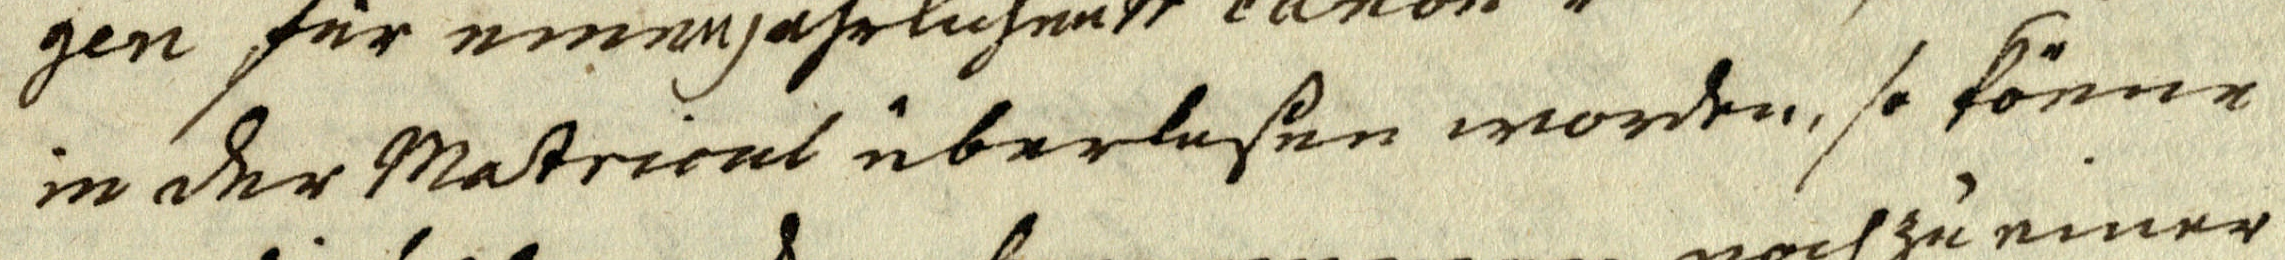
in der Matricul überlaßen worden, so könne
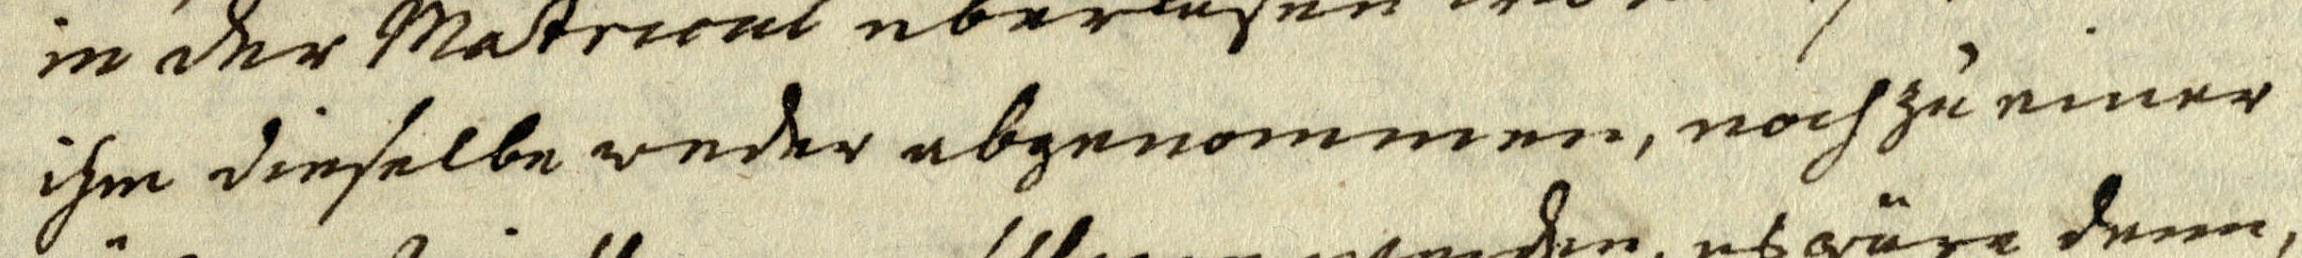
ihm dieselbe weder abgenommen, noch zu einer
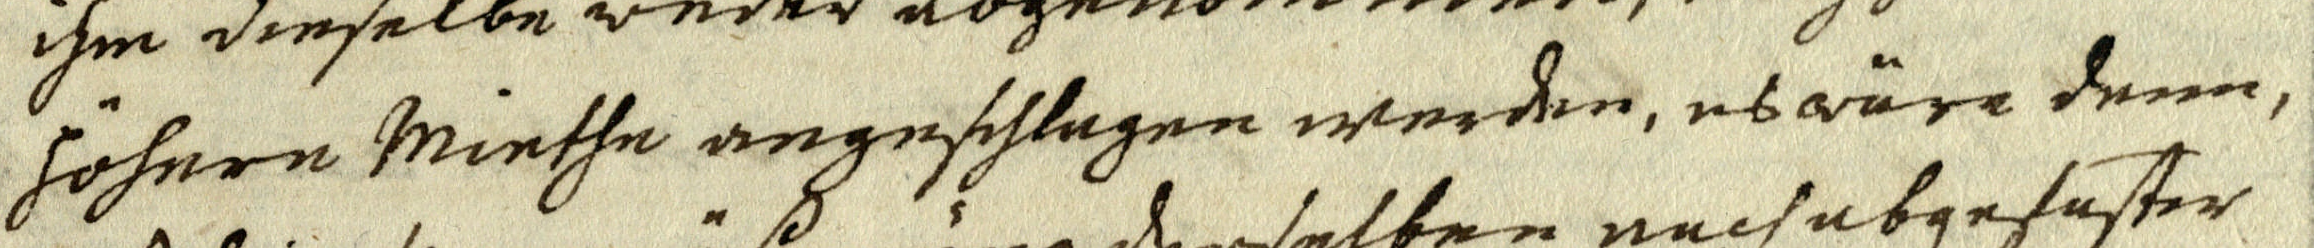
höhern Miethe angeschlagen werden, es wäre denn,
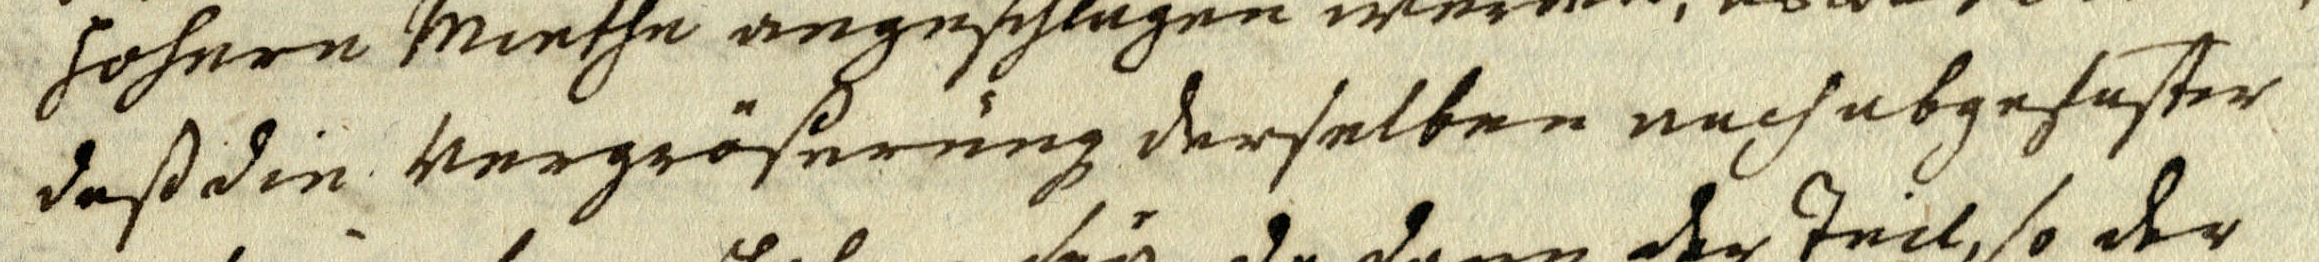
daß die Vergrößerung derselben nach abgefaster
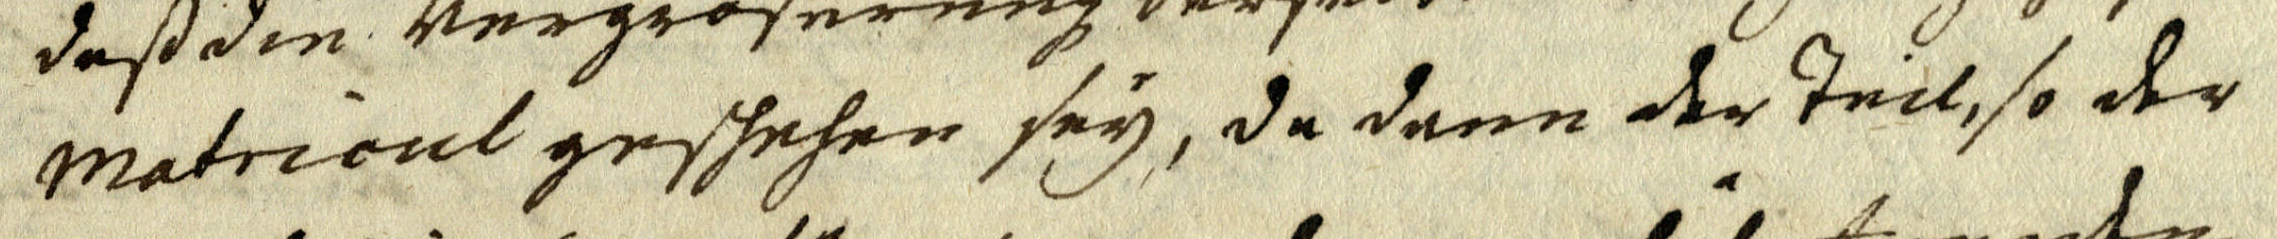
Matricul geschehen seÿ, da dann der Teil, so der
